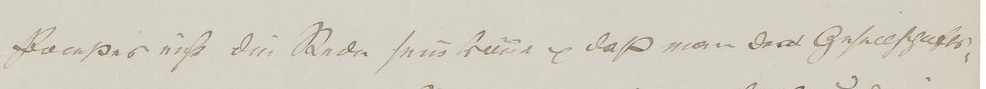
Proceßes nicht die Rede sein könne u. daß man den Gesellschafts-
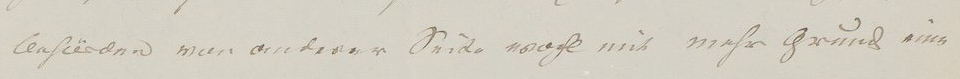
behörden von anderer Seite wohl mit mehr Grund eine
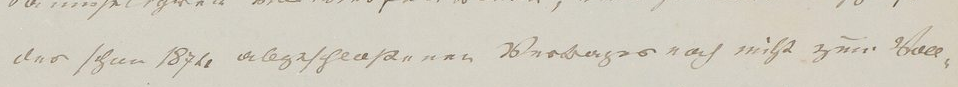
des schon 1874 abgeschloßenen Vertrages noch nicht zum Voll-
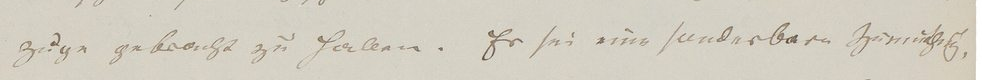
zuge gebracht zu haben. Es sei eine sonderbare Zumuthung,
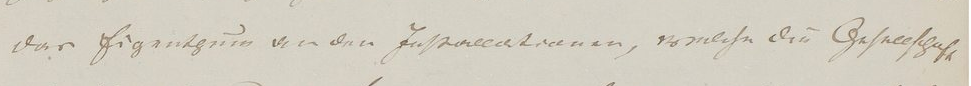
das Eigenthum an den Installationen, welche die Gesellschaft
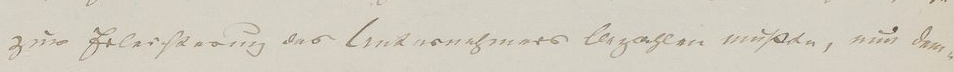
zur Erleichterung des Unternehmers bezahlen mußte, nun dem-
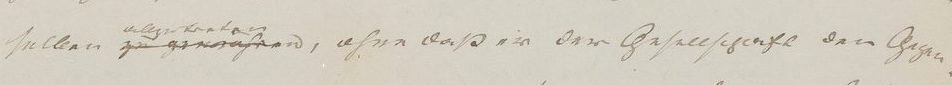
selben zu gewahrenabzutreten, ohne daß er der Gesellschaft den Gegen-
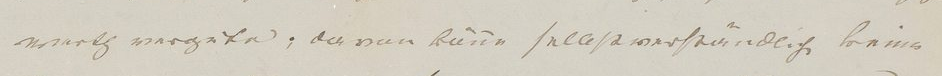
werth vergüte; davon könne selbstverständlich keine
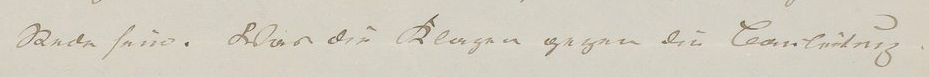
Rede sein. Was die Klagen gegen die Bauleitung
